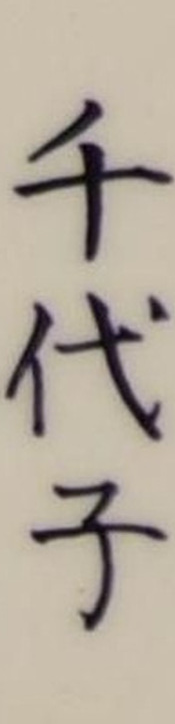千代子
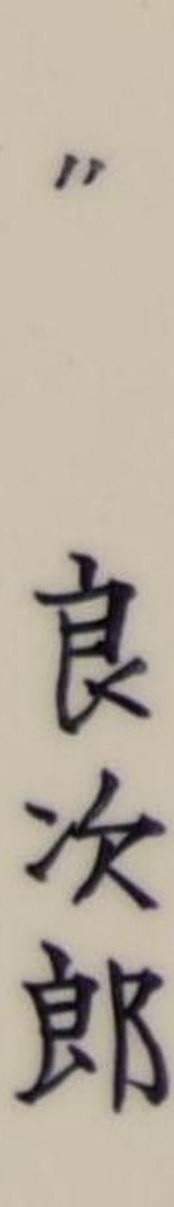良次郎
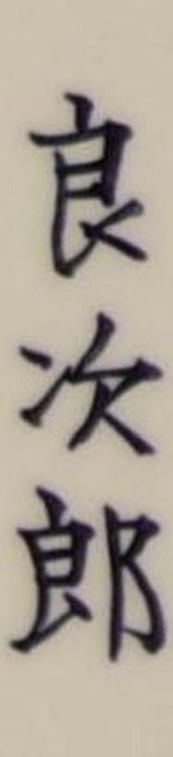良次郎

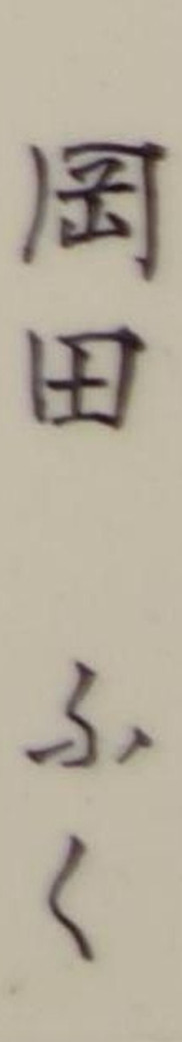岡田ふく

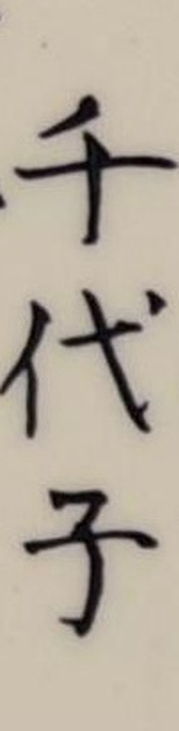千代子
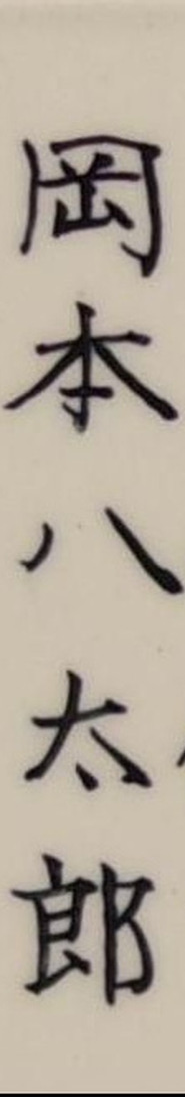岡本八太郎
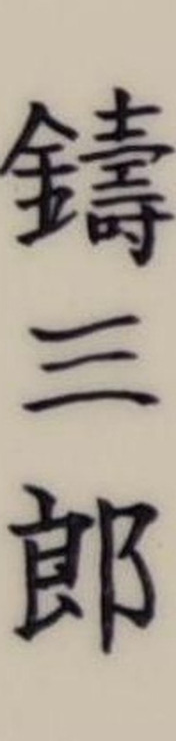鋳三郎
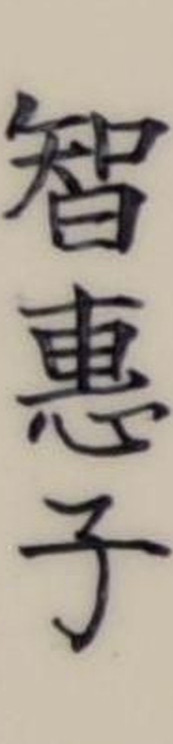智恵子
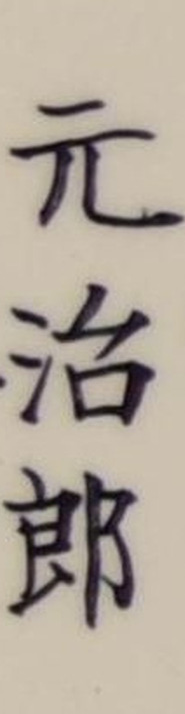元治郎

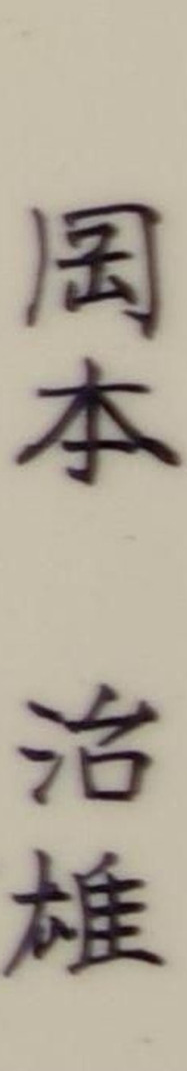岡本治雄
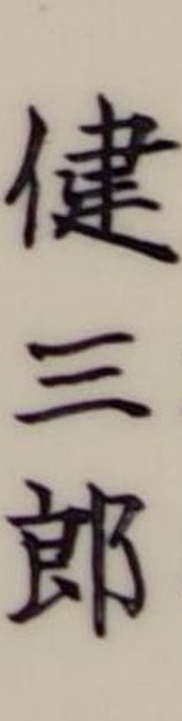健三郎
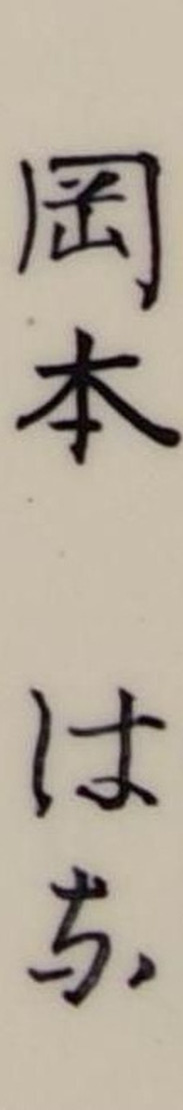岡本はな
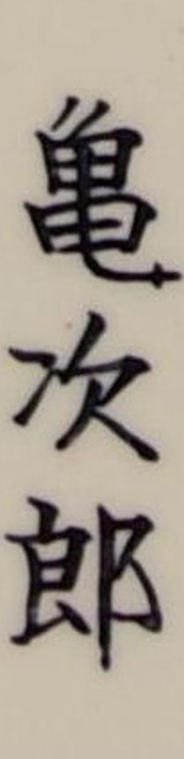亀次郎
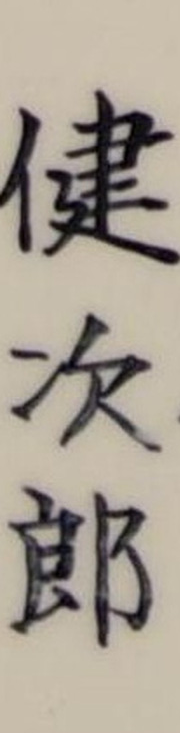健次郎
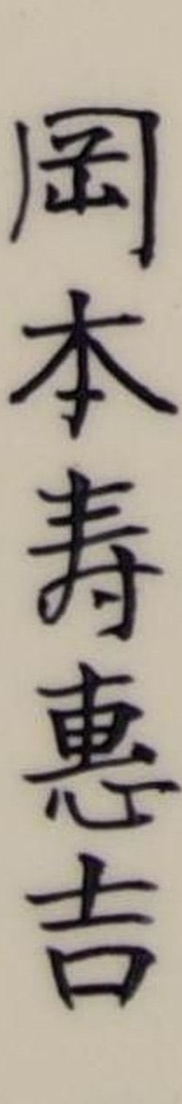岡本寿恵吉
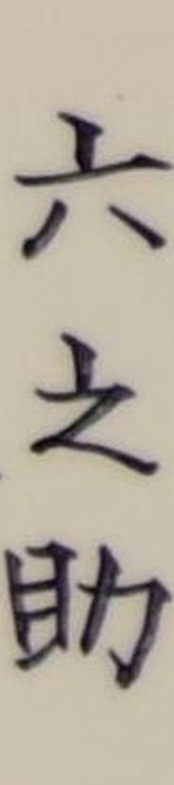六之助
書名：E~L
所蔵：高野山金剛峯寺
